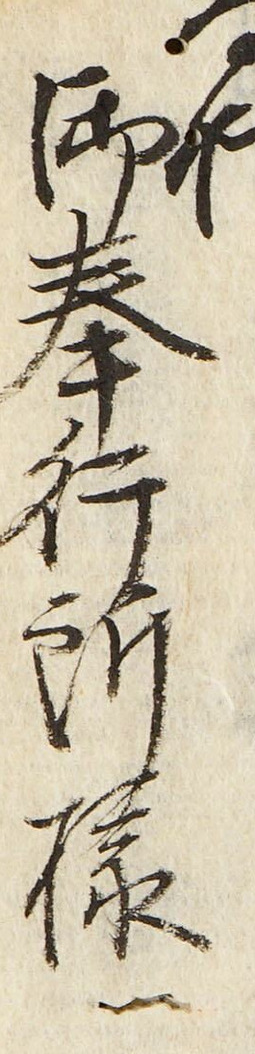御奉行所様

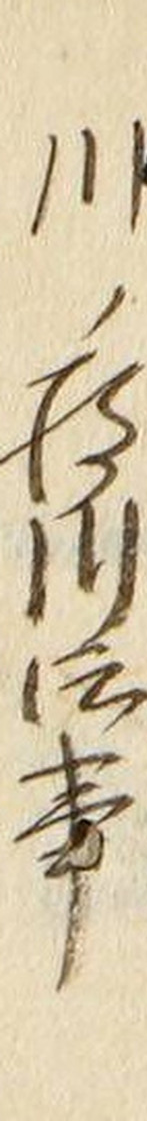川ノ枝川伝事
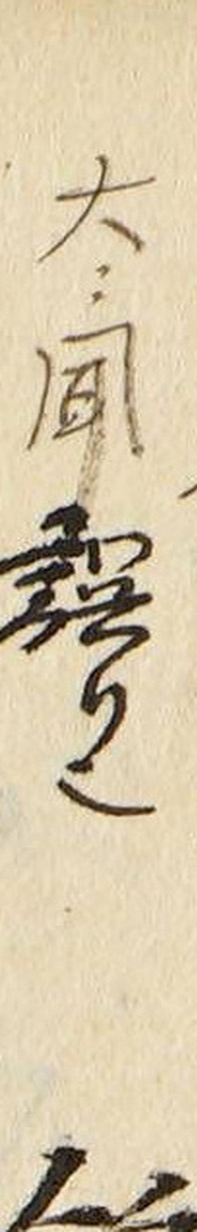大ニ聞誤り也
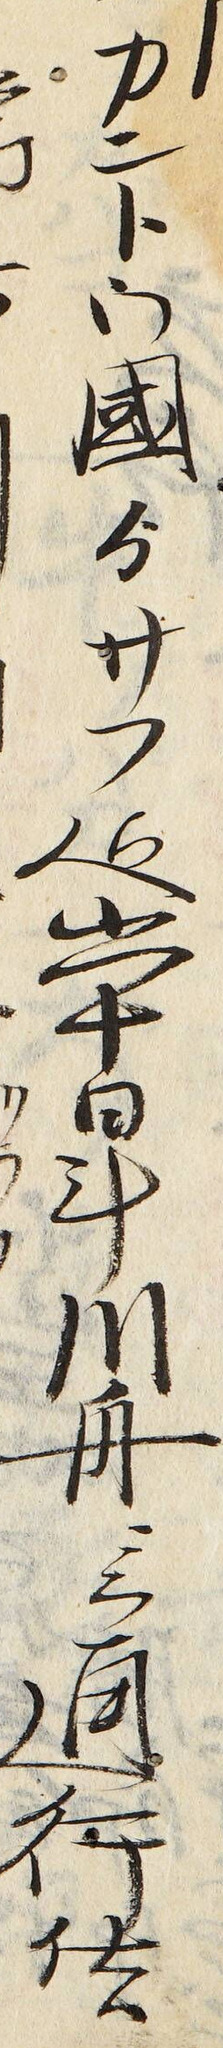カントウ国ゟサフ迠六十日計川舟ニテ通行仕候
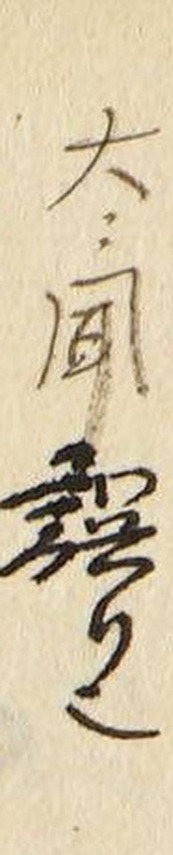大ニ聞誤り也
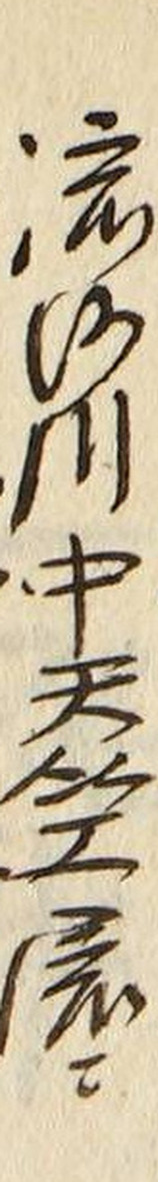流沙川中天竺流て
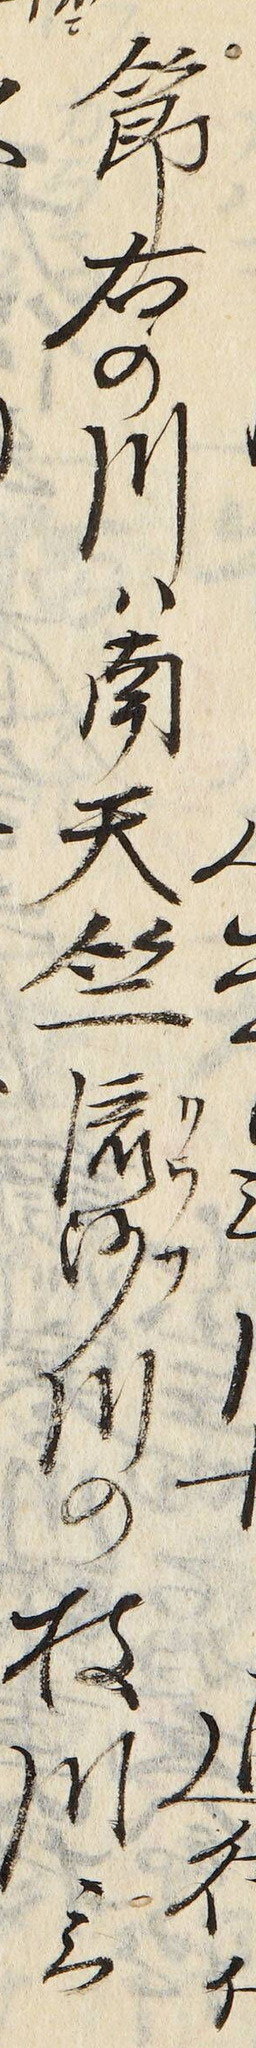節右の川は南天竺流沙川の枝川ニテ
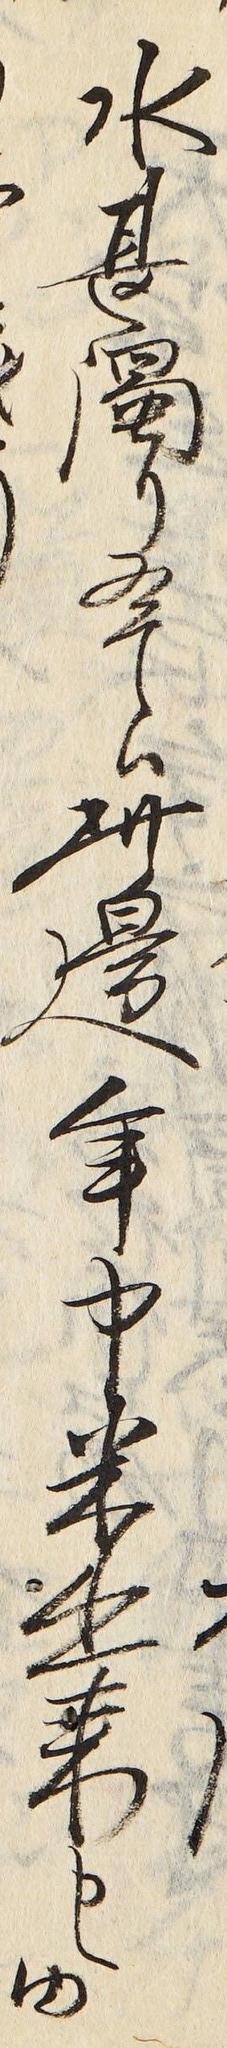水甚濁り有之候此辺年中米出来申候由
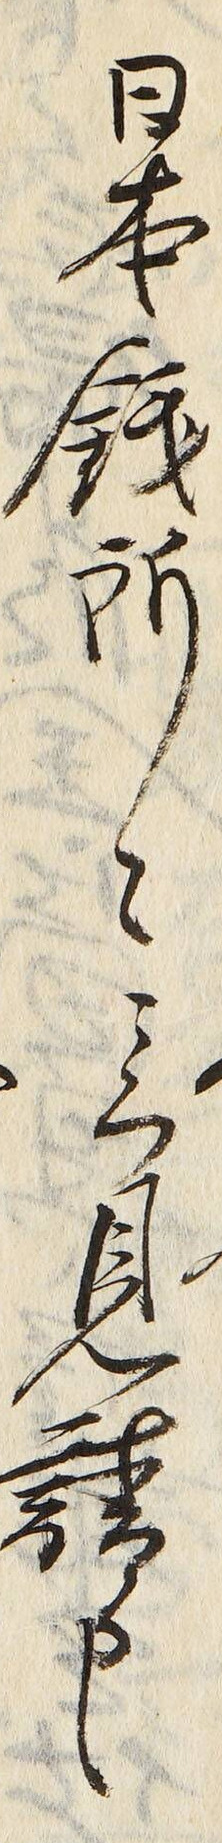日本銭所々ニ而見請申候
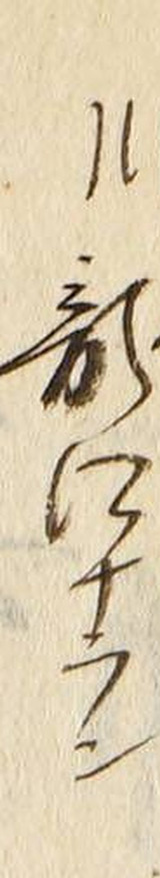川龍江ナラン
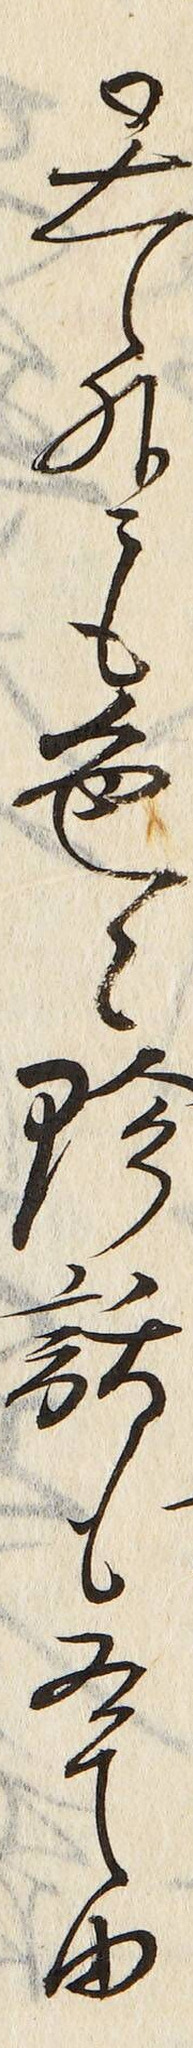〇右之外ニも色々珍話も有之由
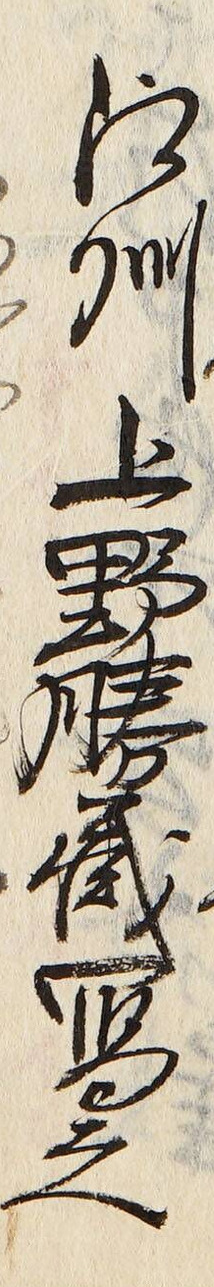江州上野勝蔵写之
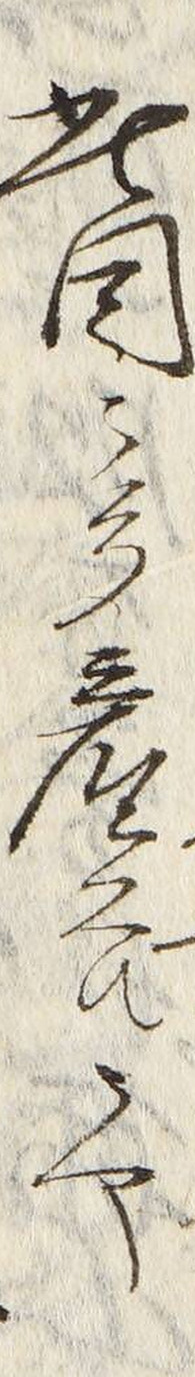此国ニ多産スルニヤ
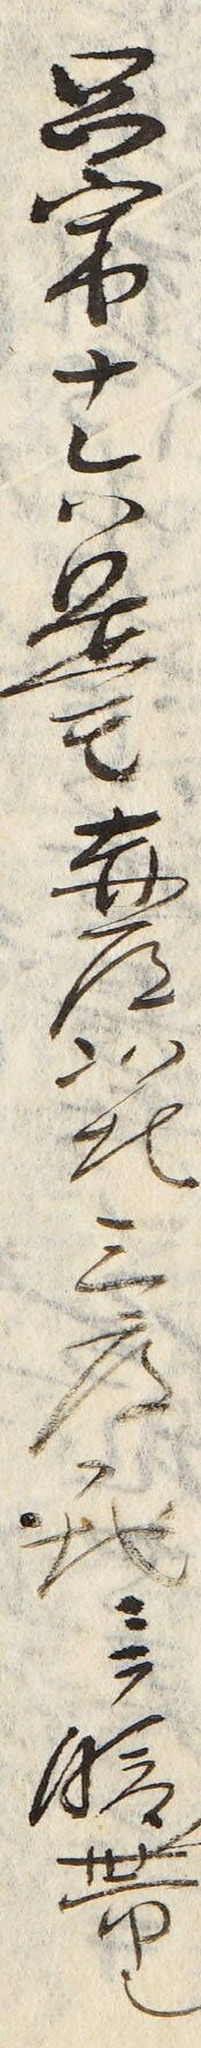呂宋ナレは是も赤道以北三度ノ地ニテ暖帯也

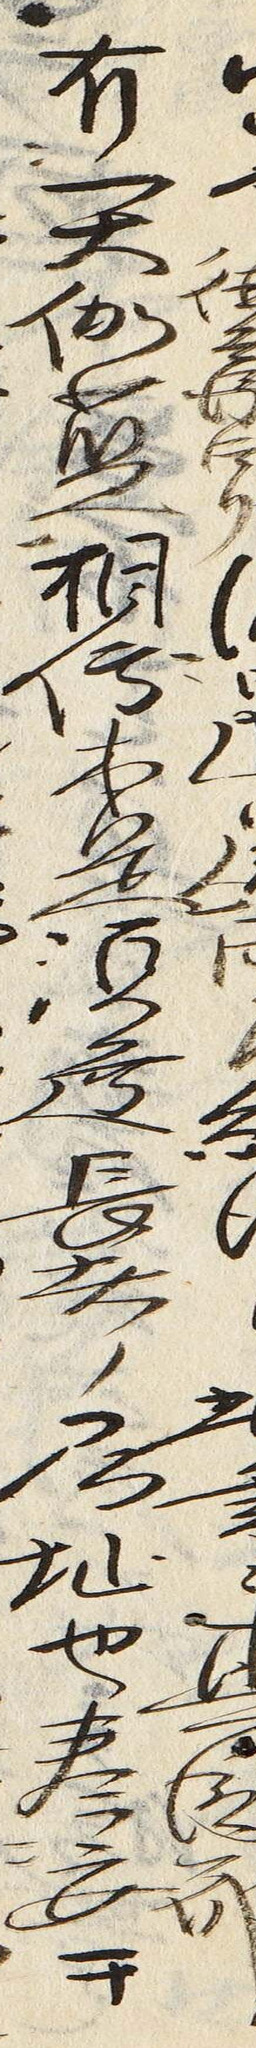有一大伽藍相伝木是須達長者ノ居址也奏安ヲ
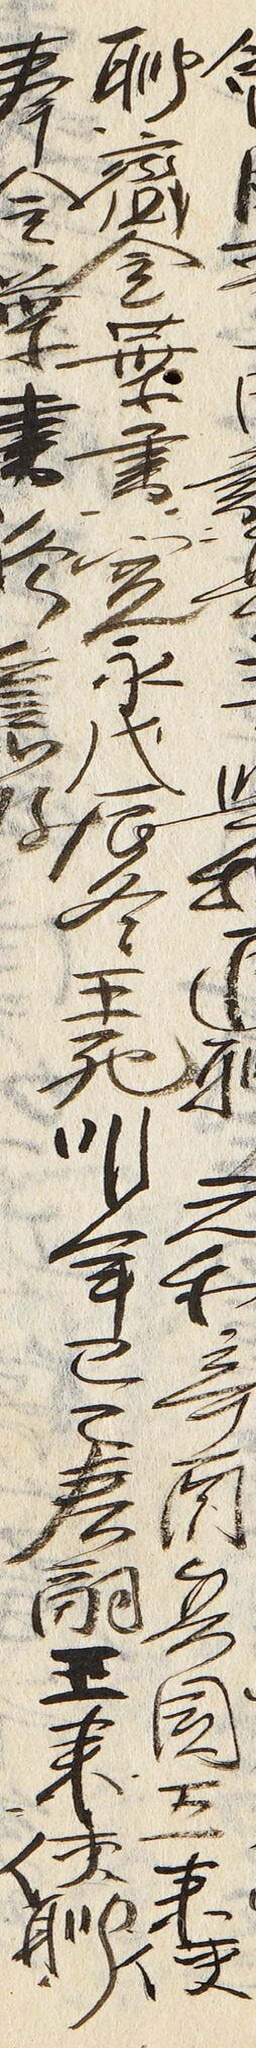聘齎金葉書ニ寛永戌辰冬王死明年巳己春嗣王来使聘
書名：漂流記
